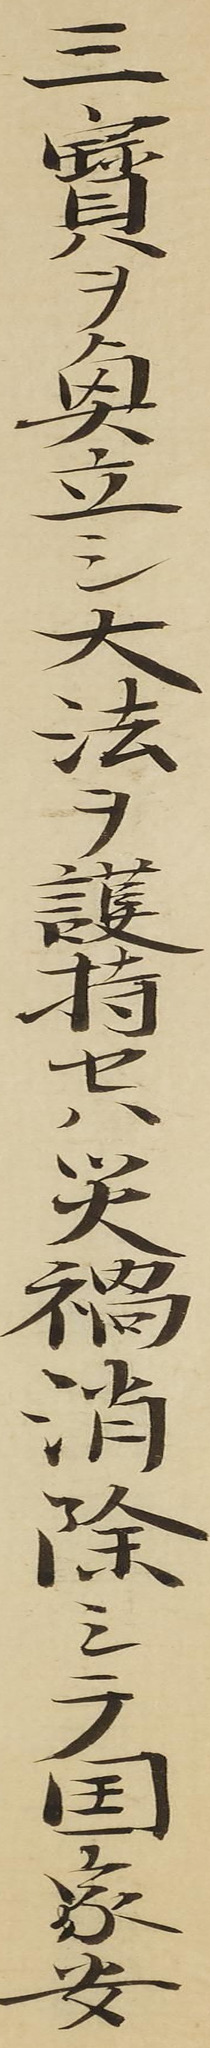三宝ヲ興立シ大法ヲ護持セハ災禍消除シテ国家安
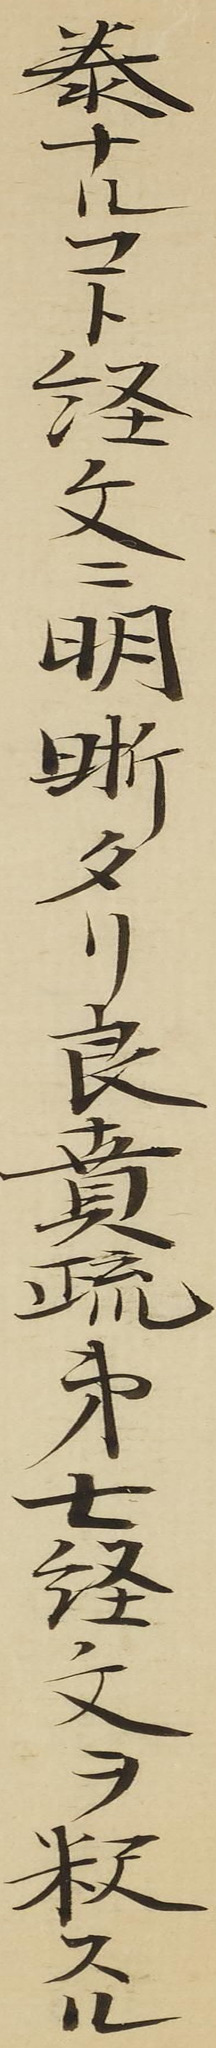泰ナルコト経文ニ明晰タリ良賁疏第七経文ヲ釈スル
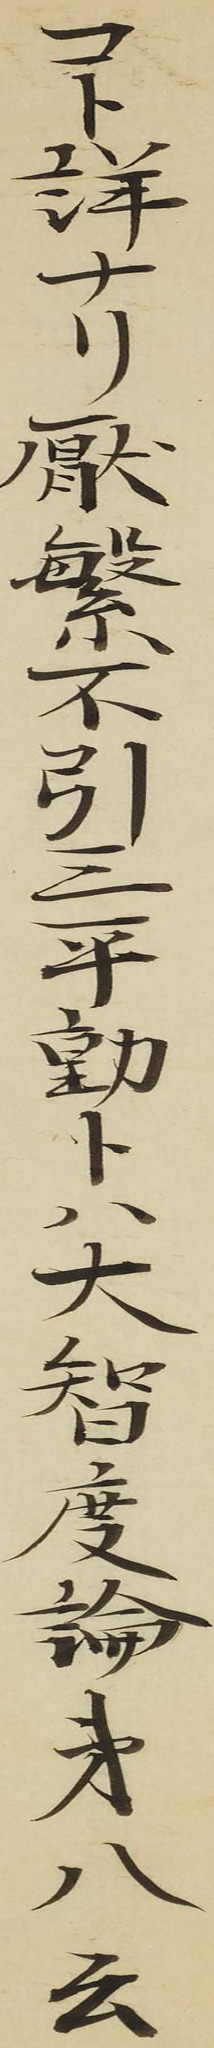コト詳ナリ厭繁不引三平動トハ大智度論第八云
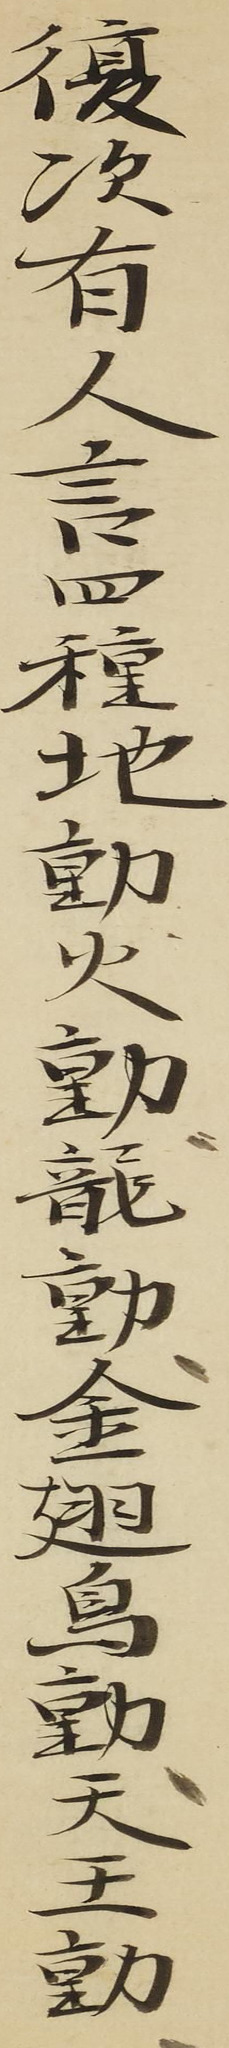復次有人言四種地動火動、龍動、金翅鳥動、天王動、
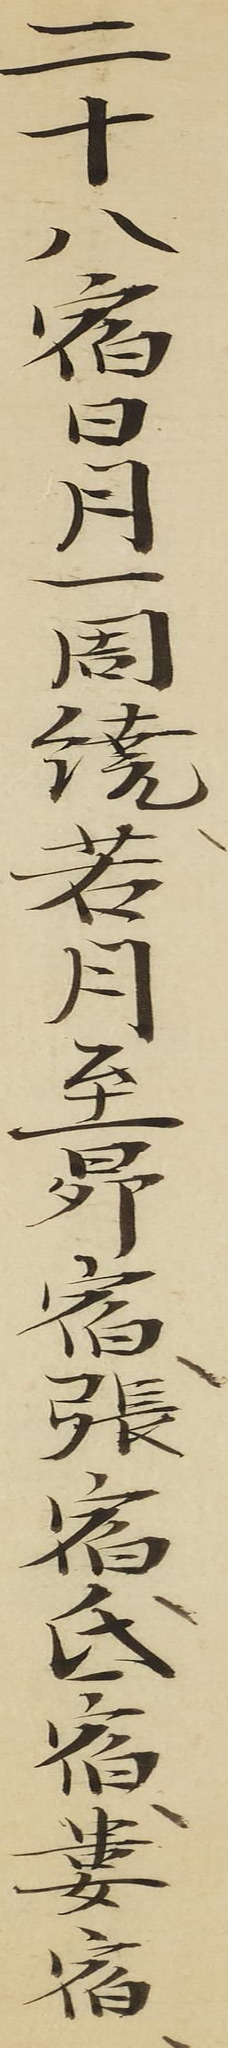二十八宿日月一周繞、若月至昴宿、張宿、氐宿、婁宿、
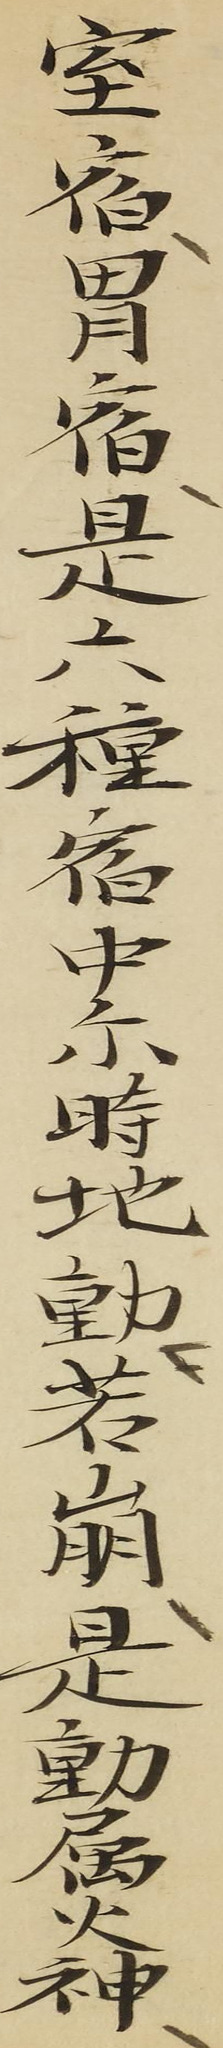室宿、胃宿、是六種宿中尓時地動、若崩、是動属火神、
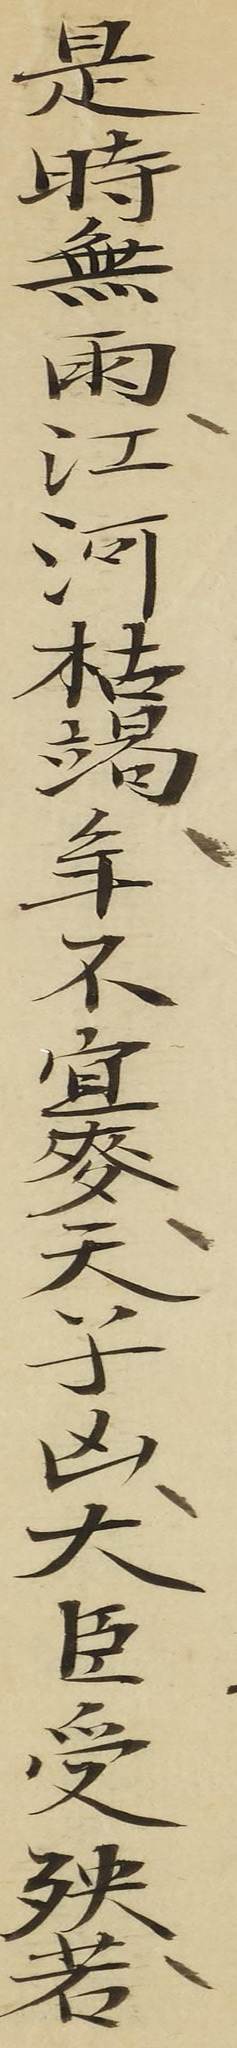是時無雨、江河枯竭、年不宜麦、天子凶、大臣受殃、若
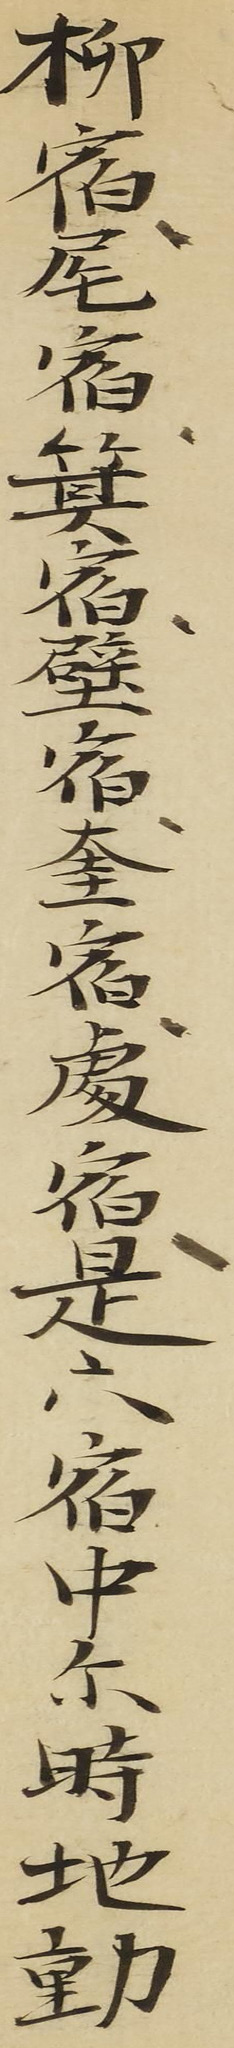柳宿、尾宿、箕宿、壁宿、奎宿、処宿、是六宿中尓時地動
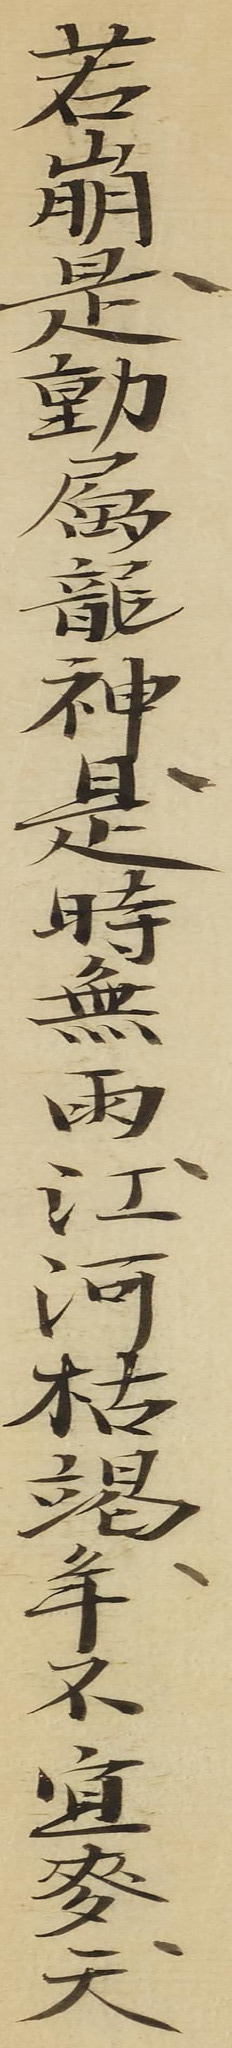若崩、是動属龍神、是時無雨、江河枯竭、年不宜麦、天
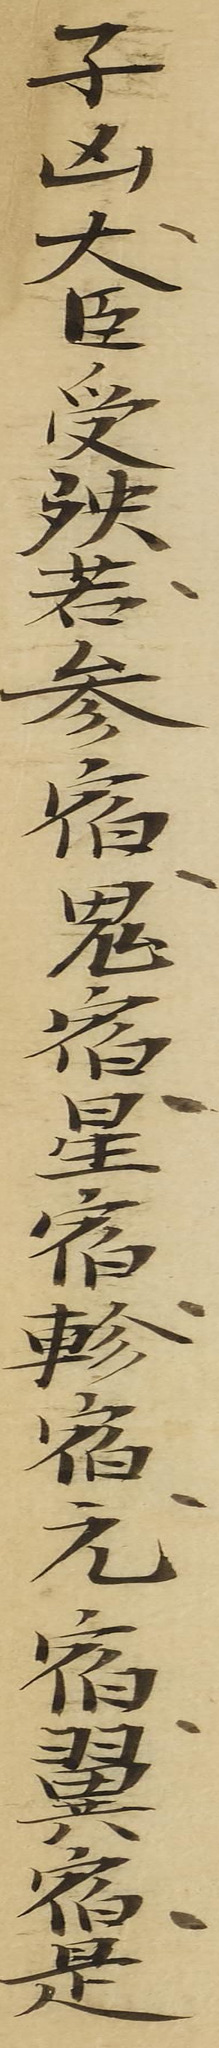子凶、大臣受殃、若参宿、鬼宿、星宿、軫宿、亢宿、翼宿、是

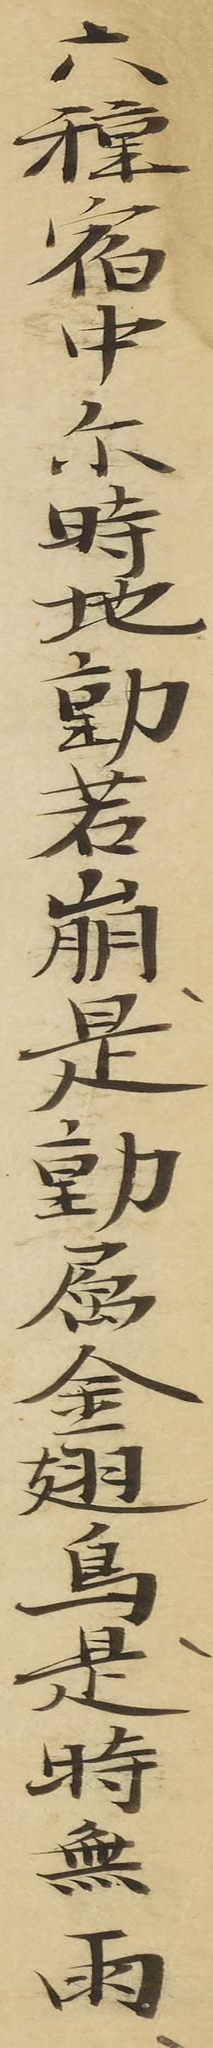六種宿中尓時地動若崩、是動属金翅鳥、是時無雨、
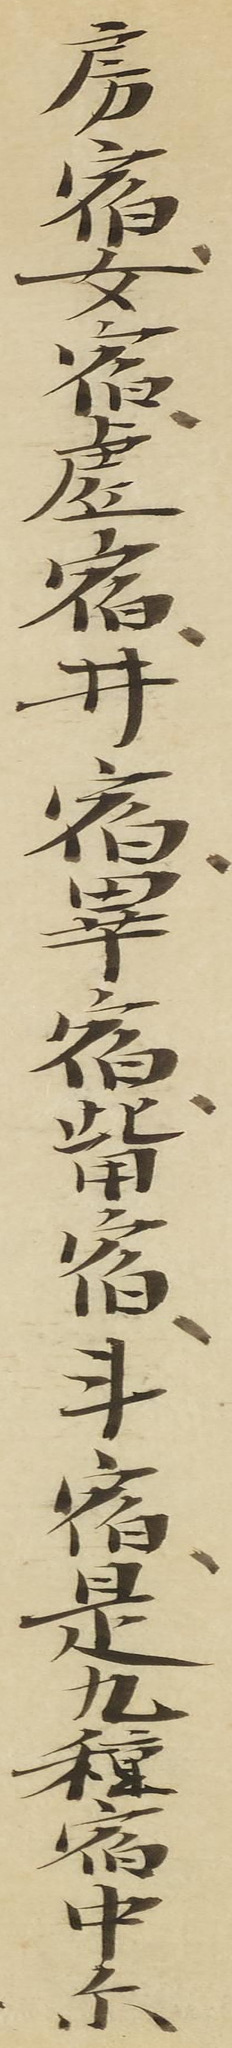房宿、女宿、虚宿、井宿、畢宿、觜宿、斗宿、是九種宿中尓
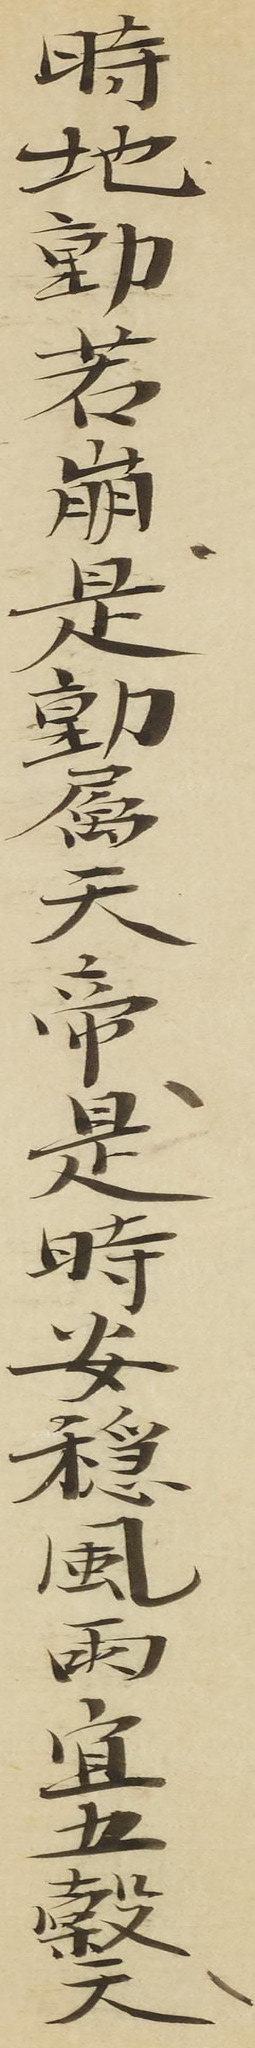時地動若崩、是動属天帝、是時安穏風雨宜五穀、天
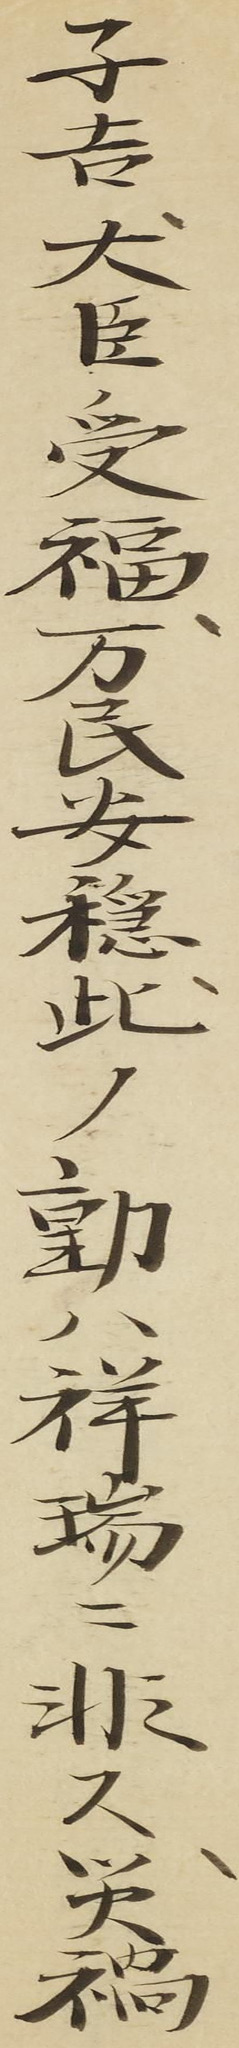子吉、大臣受福、万民安穏、此ノ動ハ祥瑞ニ非ス、災禍
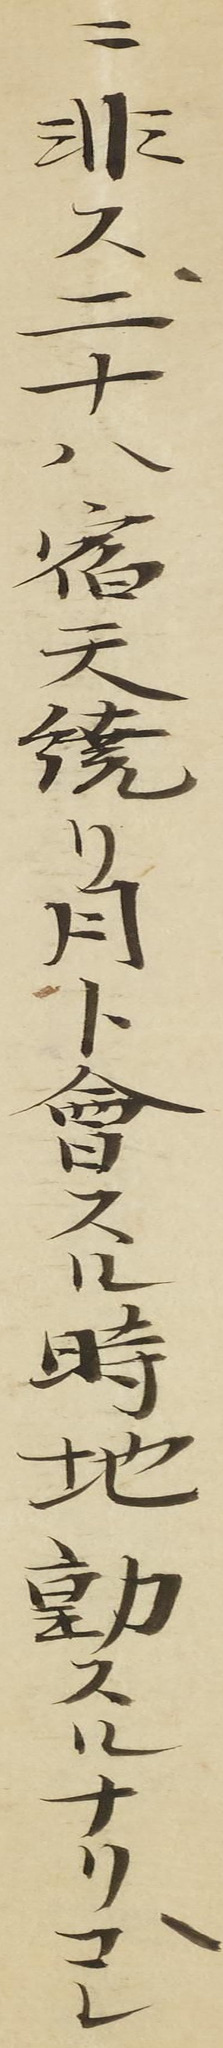ニ非ス、二十八宿天繞リ月ト会スル時地動スルナリ、コレ
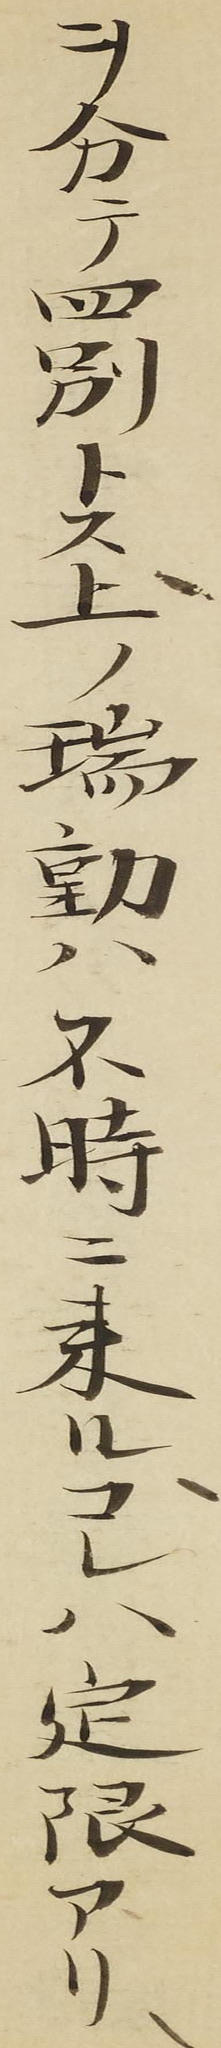ヲ分テ四別トス、上ノ瑞動ハ不時ニ来ル、コレハ定限アリ、
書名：地震説　鶴高山善仁寺天柗老人著述　全
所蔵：東京大学地震研究所図書室 Earthquake Research Institute Library, The University of Tokyo, JAPAN
